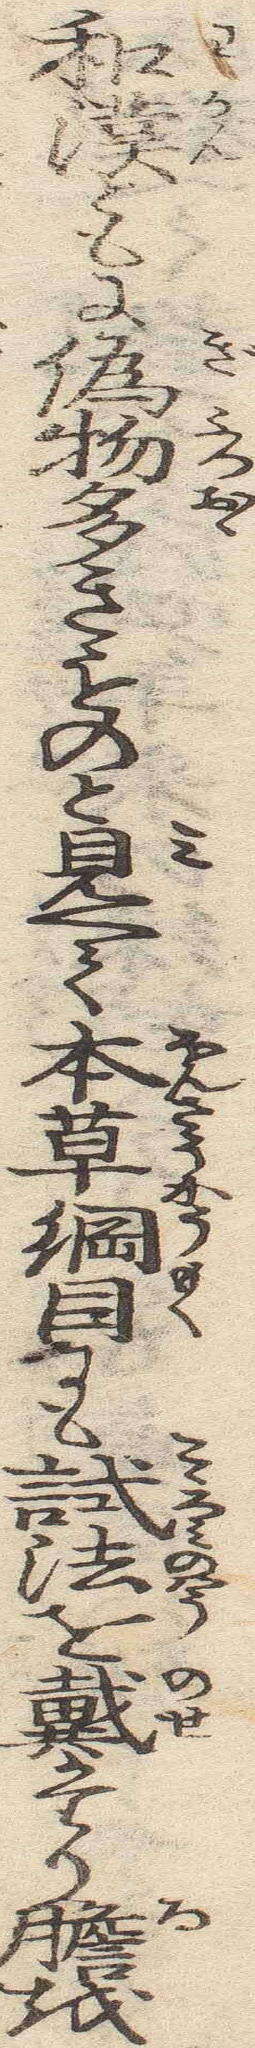和漢ともに偽物多きものと見へて本草綱目にも試法を載たり膽を
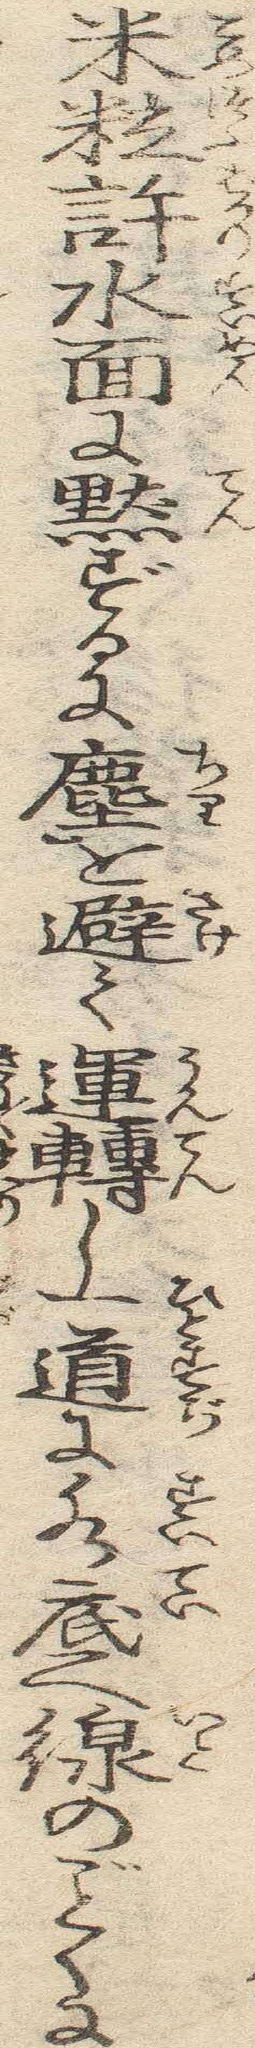米粒許水面に黙ずるに塵を避て運転し一道に水底へ線のごとくに
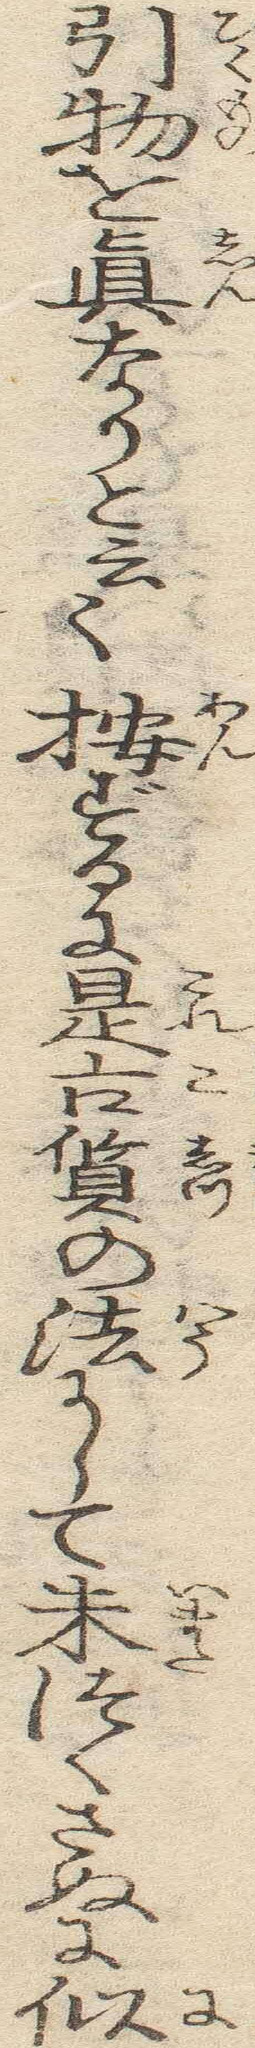引物を真なりと云て按ずるに是古質の法にして未つくさぬに似
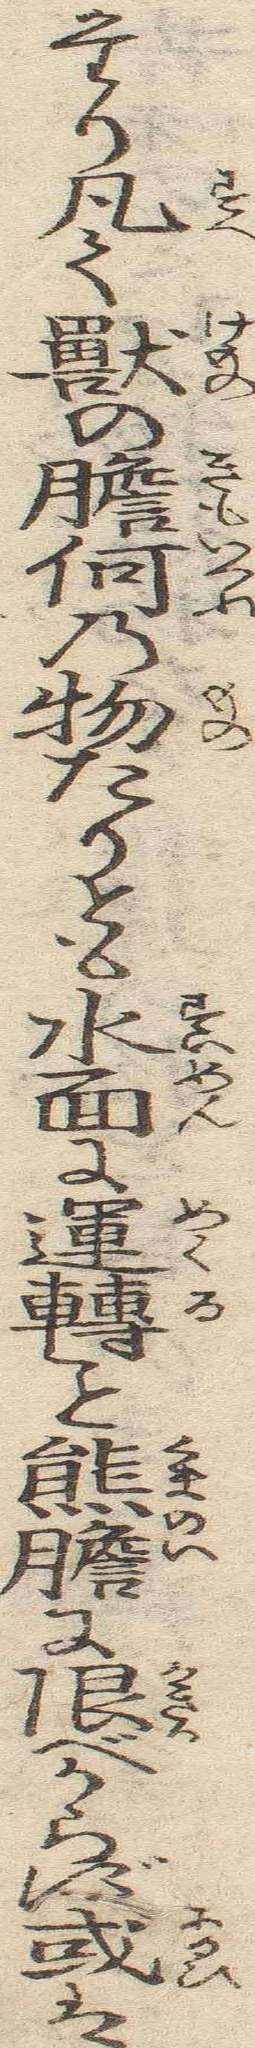たり凡て獣の膽何の物たりとも水面に運転こと熊膽に限べからず或は
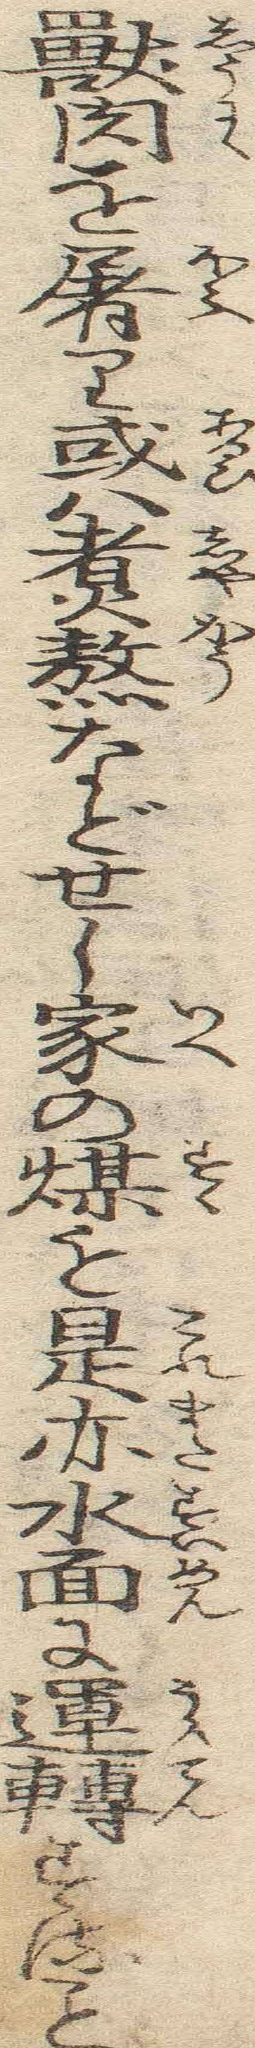獣肉を屠り或は煮熬などせし家の煤を是亦水面に運転すること
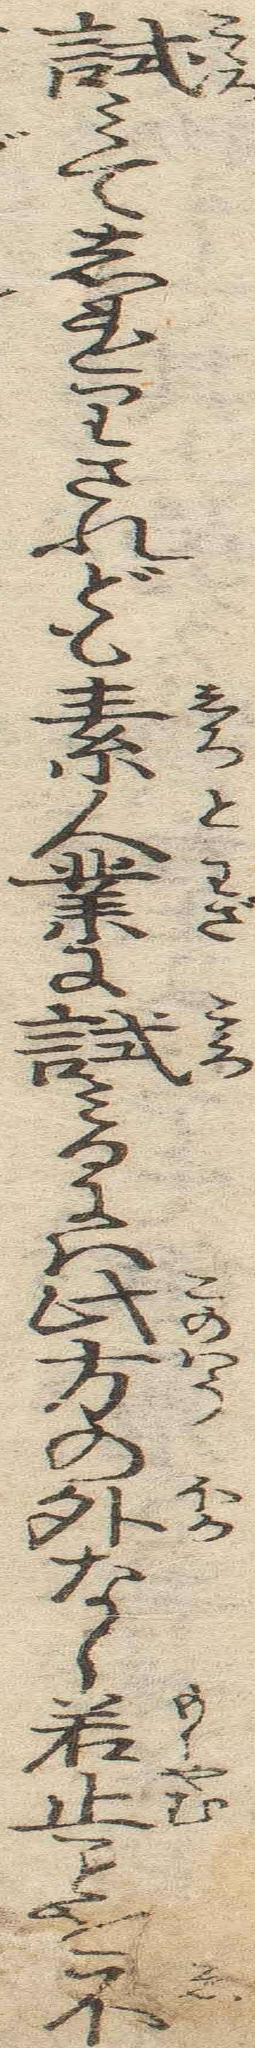試みてしれりされども素人業に試みるには此方の外なし若止ことを不
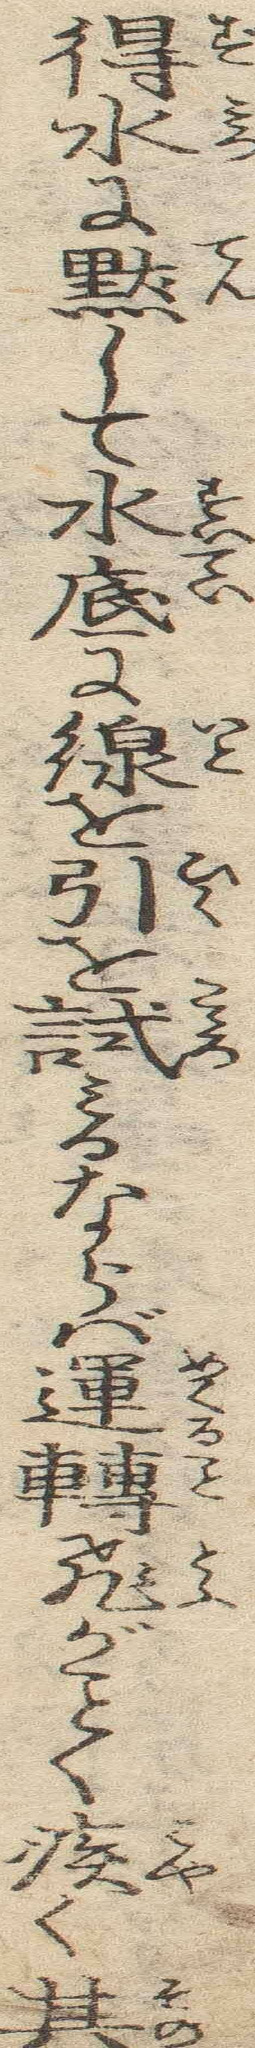得水に黙して水底に線を引を試みるならば運転飛がことく疾く其
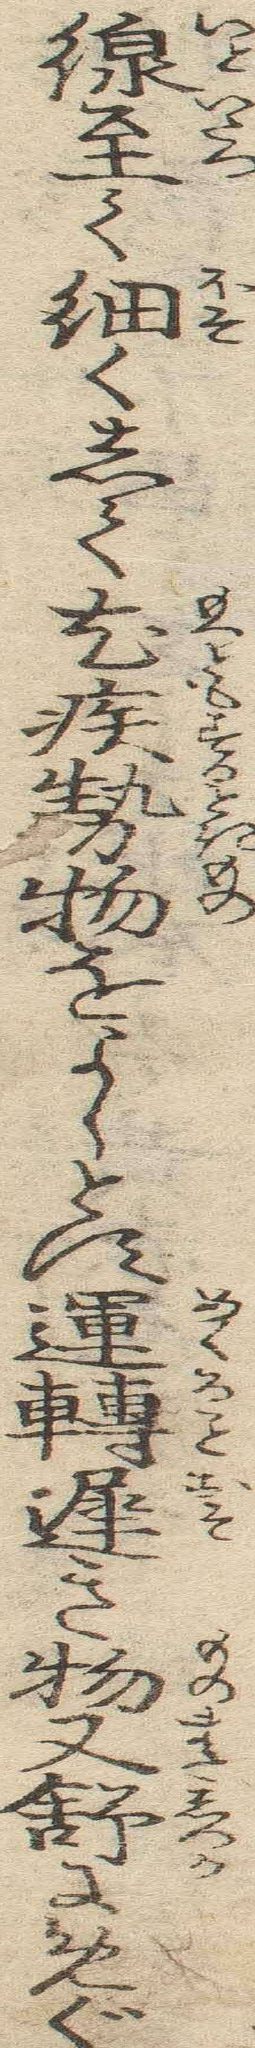線至て細くして尤疾勢物をよしとす運転遅き物又舒にめぐ
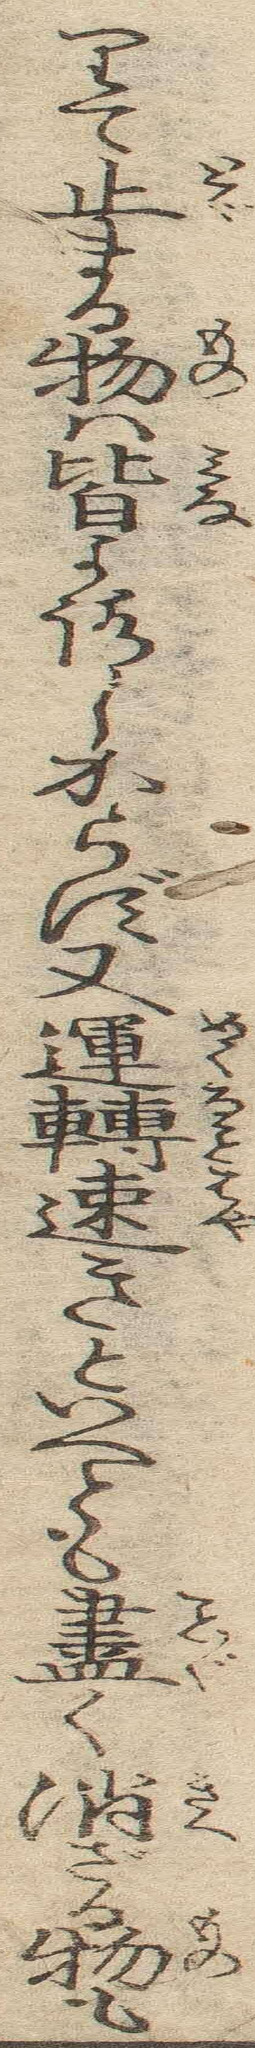りて止まる物は皆よろしからず又運転速きといへとも盡く消ざる物も

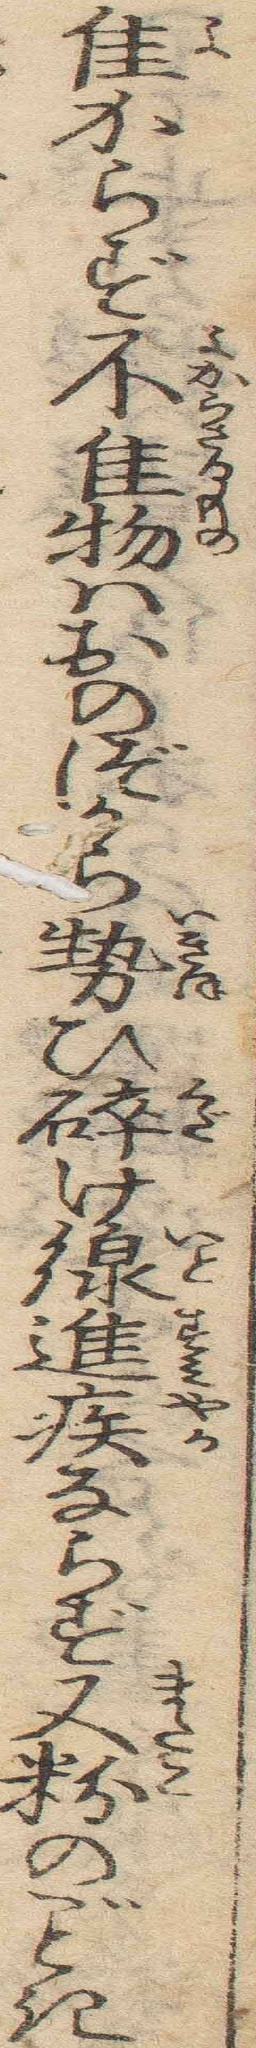佳からず不佳物はおのずから勢ひ砕け線進疾ならず又粉のごとき
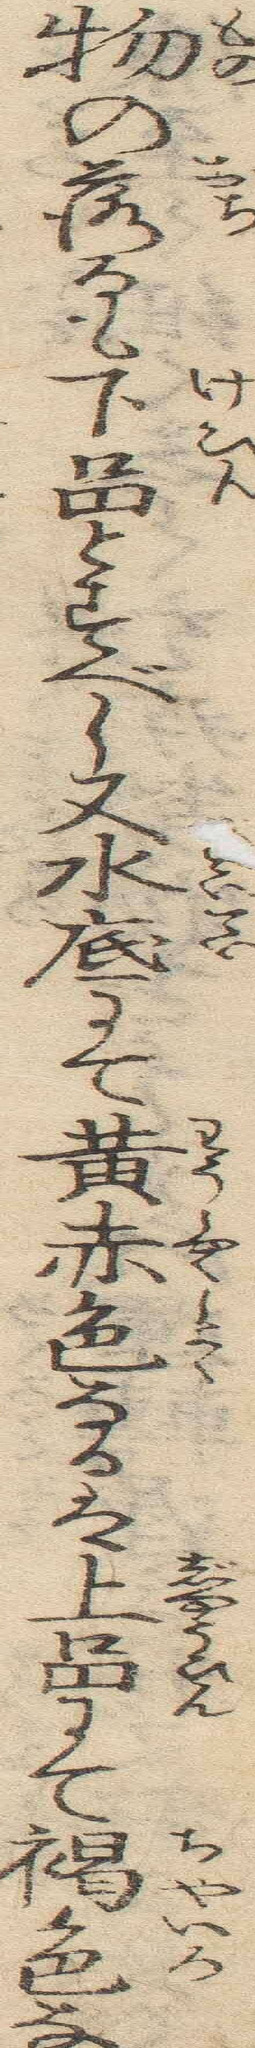物の落るも下品とすべし又水底にて黄赤色なるは上品にて褐色な
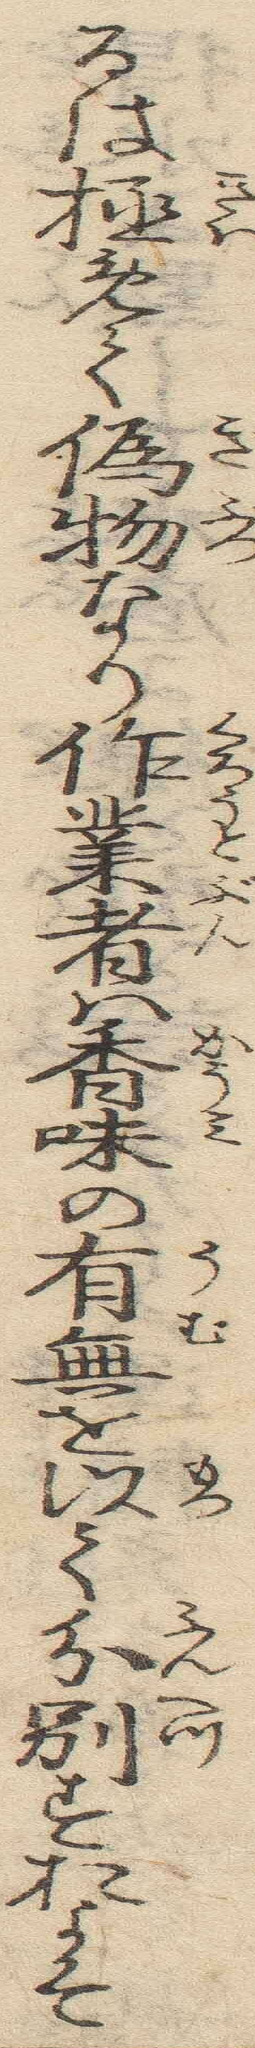るは極めて偽物なり作業者は香味の有無を以て分別すおよそ
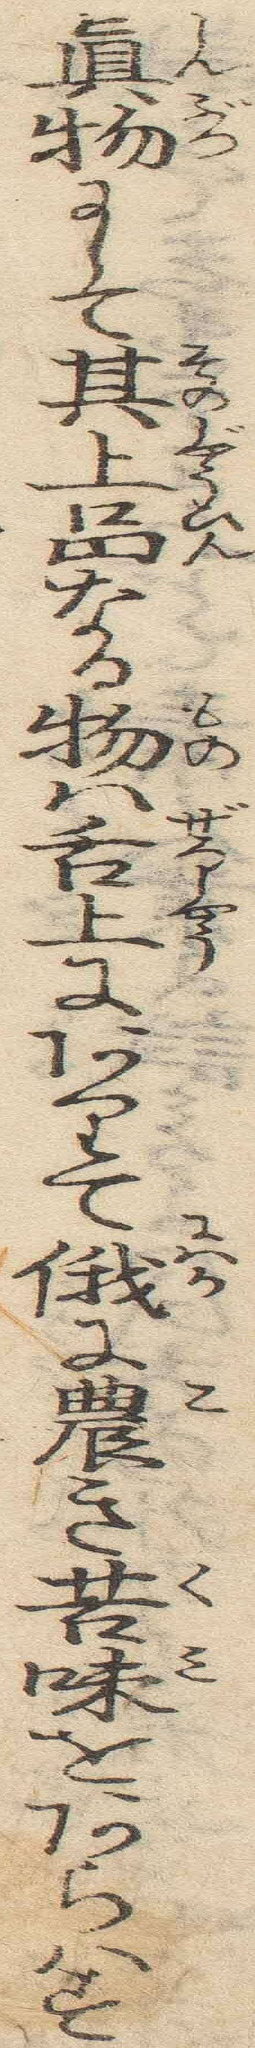真物にして其上品なる物は舌上にありて俄に農き苦味をあらはす
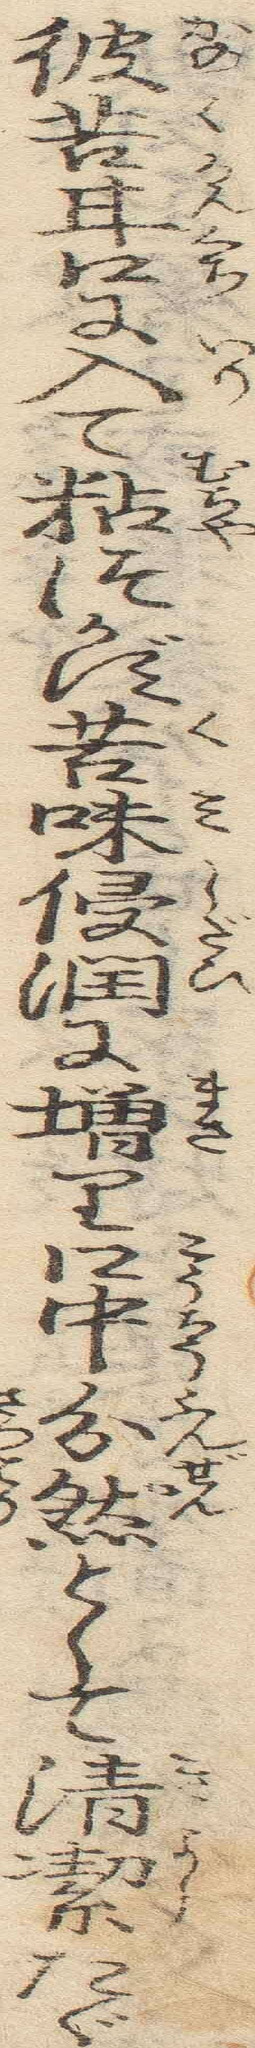彼苦甘口に入て粘つかず苦味侵潤に増り口中分然として清潔たゞ
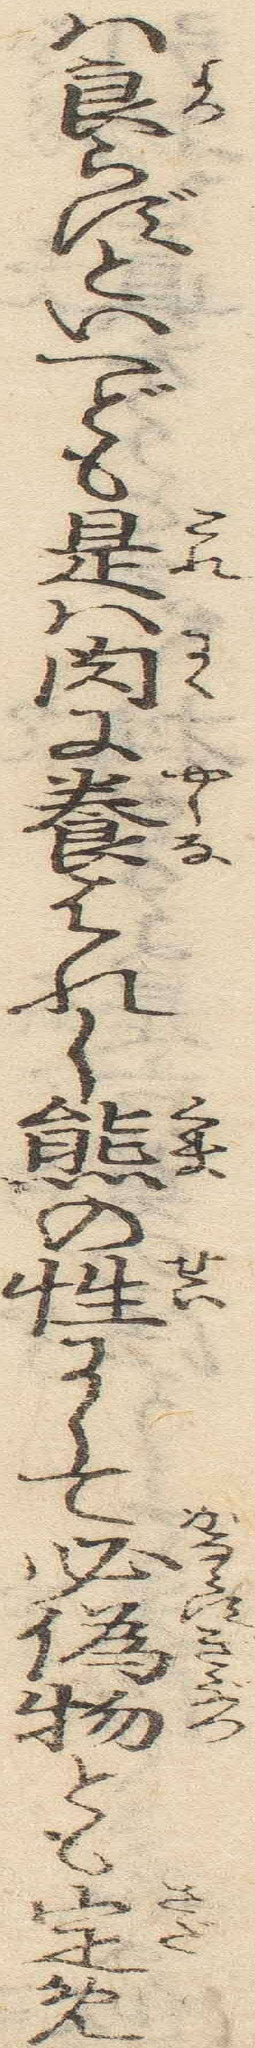は良らずといへども是は肉に養はれし熊の性にして必偽物とも定め
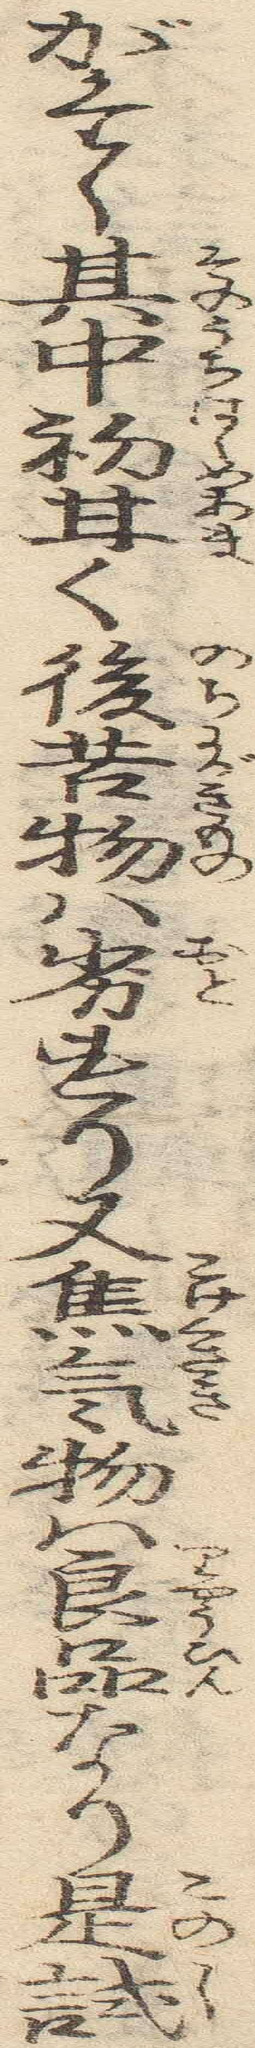がたし其中初甘く後苦物は劣れり又焦気物は良品なり是試
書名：日本山海名産図会
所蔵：東京学芸大学附属図書館 国文学研究資料館
